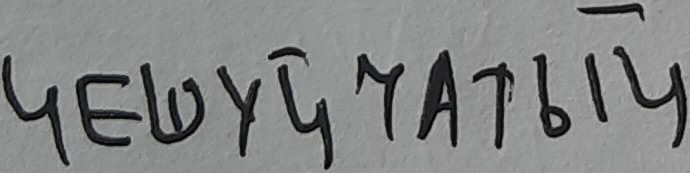чешуйчатый
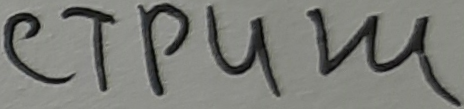стриж
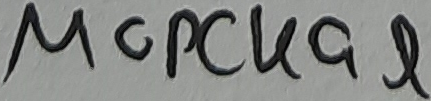морская
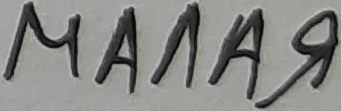малая
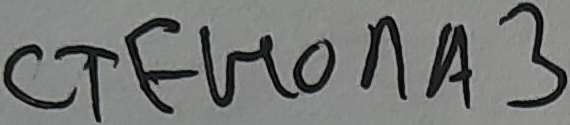стенолаз
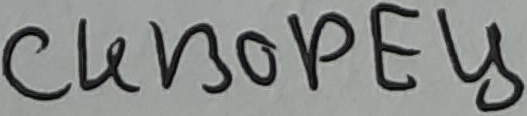скворец
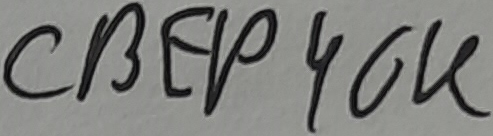сверчок
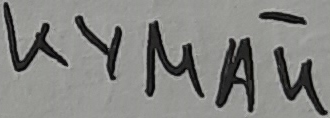кумай
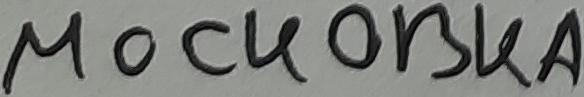московка
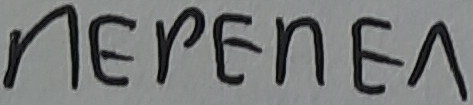перепел
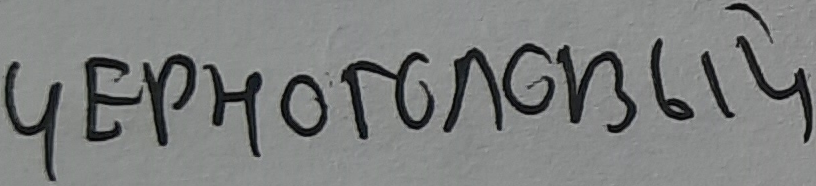черноголовый
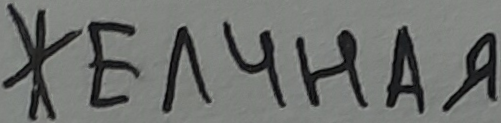желчная
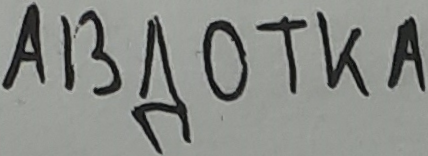авдотка
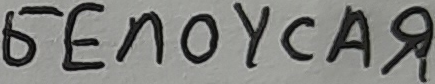белоусая
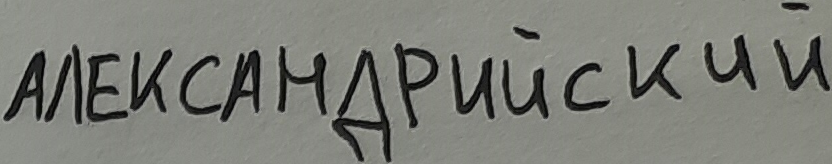александрийский
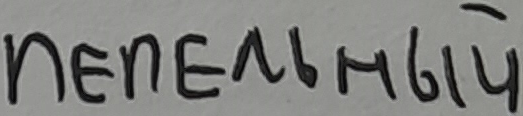пепельный
